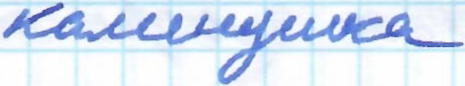каменушка
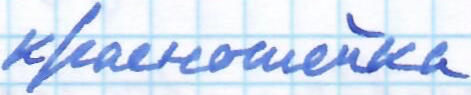красношейка
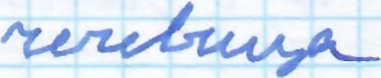чечевица
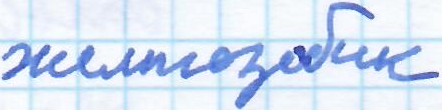желтозобик
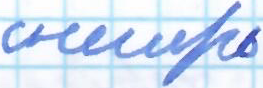снегирь
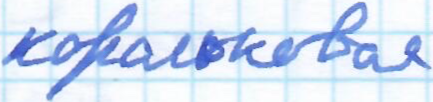корольковая
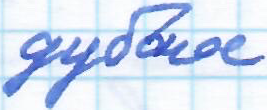дубонос
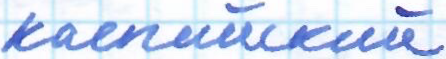каспийский
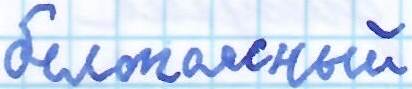белопоясный
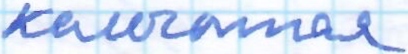кольчатая
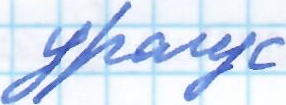урагус
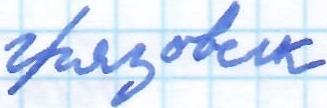грязовик
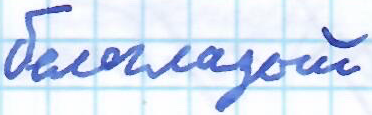белоглазый
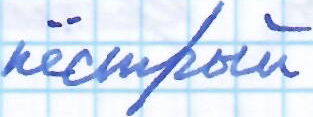пёстрый
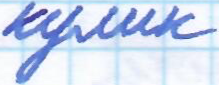кулик
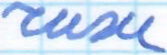чиж
